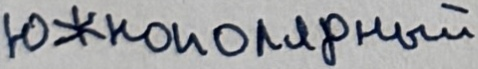южнополярный
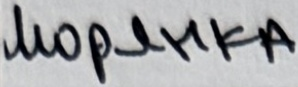морянка
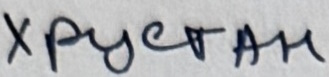хрустан
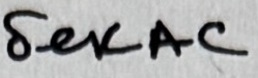бекас
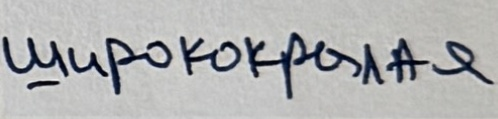ширококрылая
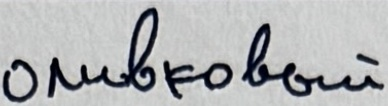оливковый
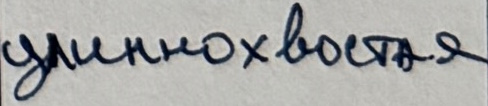длиннохвостая
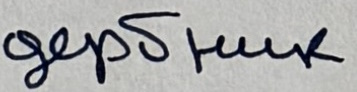дербник
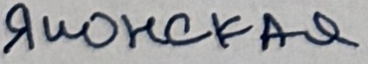японская
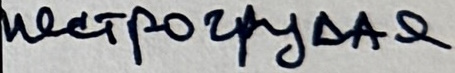пестрогрудая
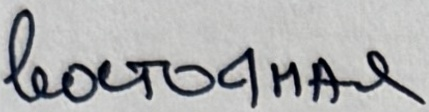восточная
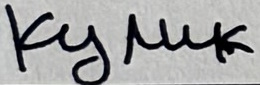кулик
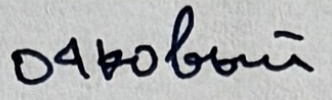очковый
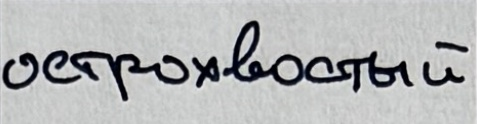острохвостый
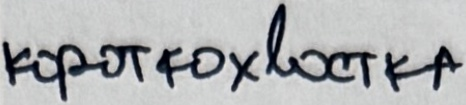короткохвостка
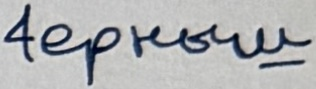черныш
